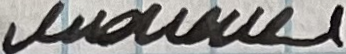японская
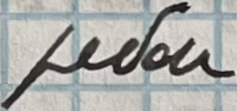рябок
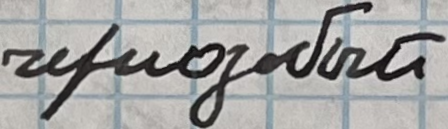чернозобый
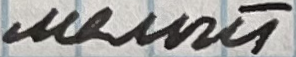малый
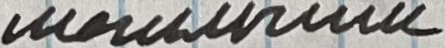могильник
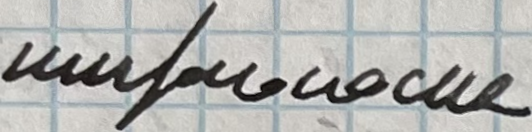широконоска
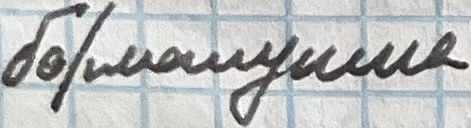бормотушка
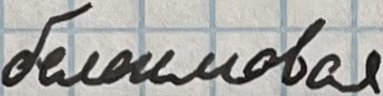белоклювая
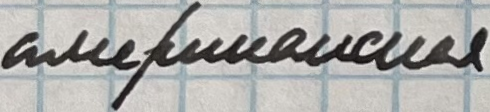американская
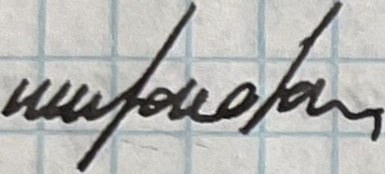широкорот
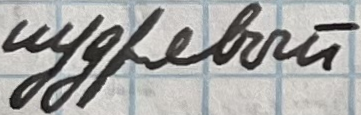кудрявый
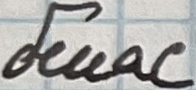бекас
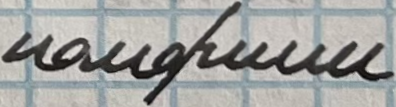поморник
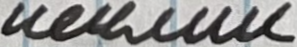кеклик
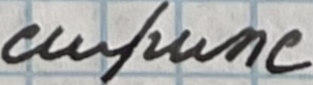стриж
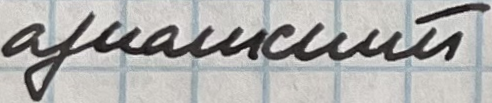азиатский
